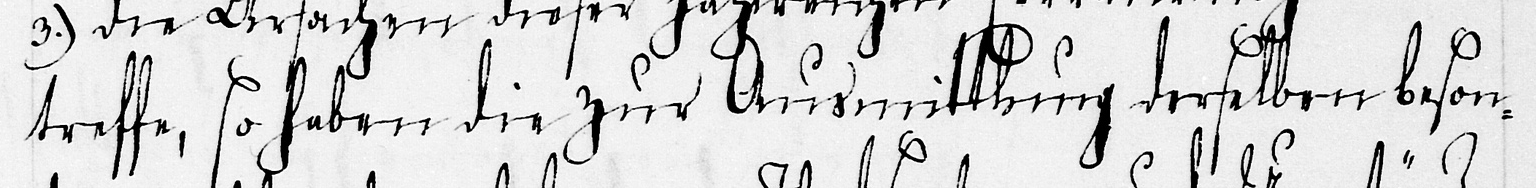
reffe, so haben die zur Ausmittlung derselben beson¬
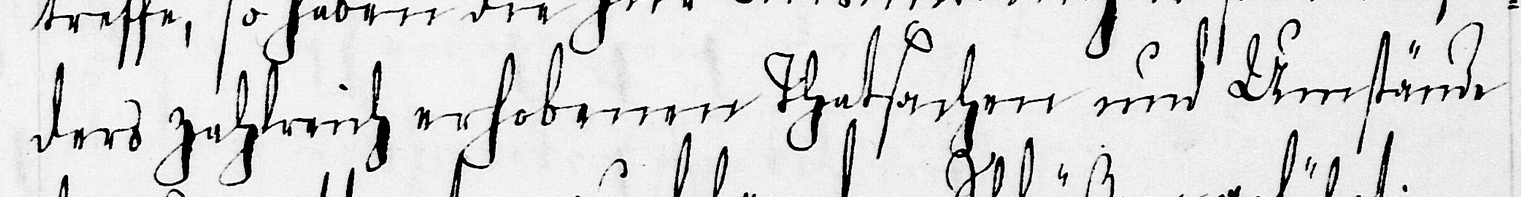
ders zahlreich erhobenen Thatsachen und Umstände
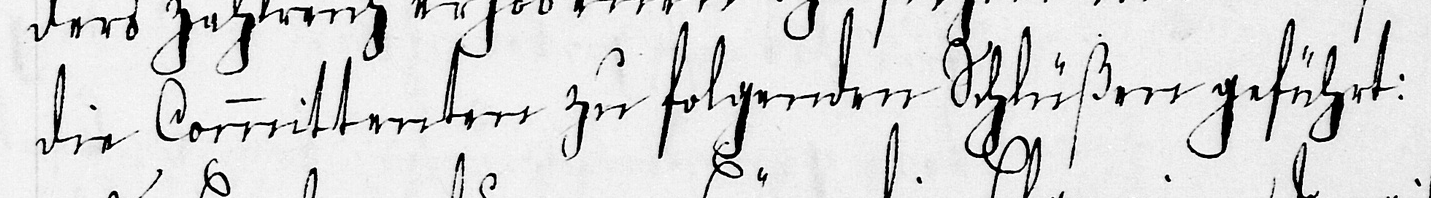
die Committenten zu folgenden Schlüßen geführt:
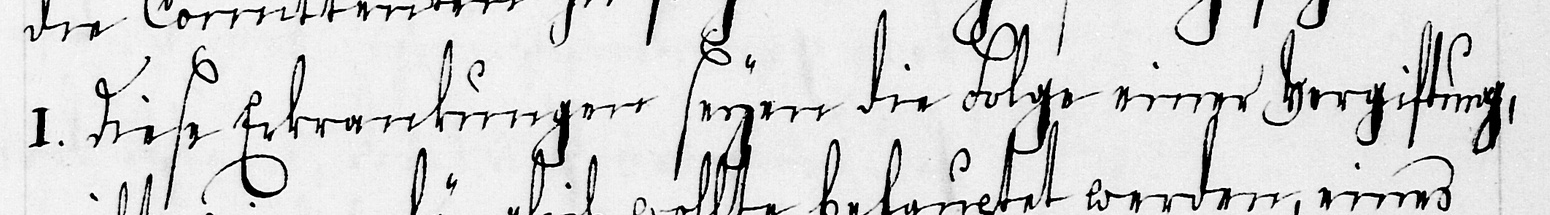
I. Diese Erkrankungen seyen die Folge einer Vergiftung,
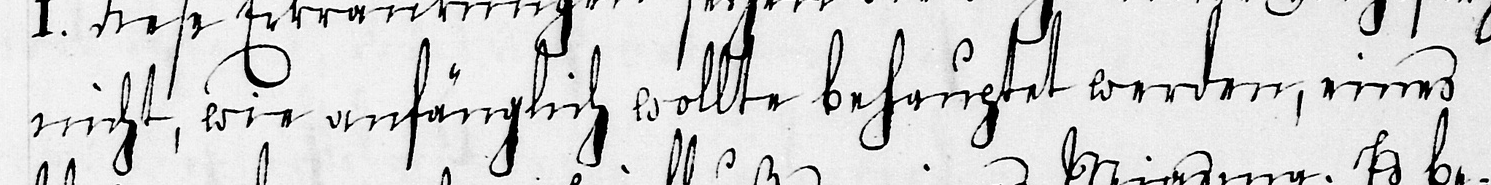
nicht, wie anfänglich wollte behauptet werden, eines
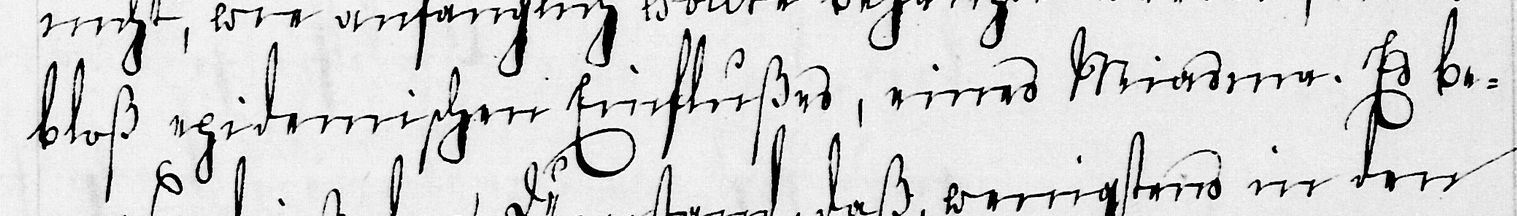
bloß epidemischen Einflußes, eines Miasma. Es be¬
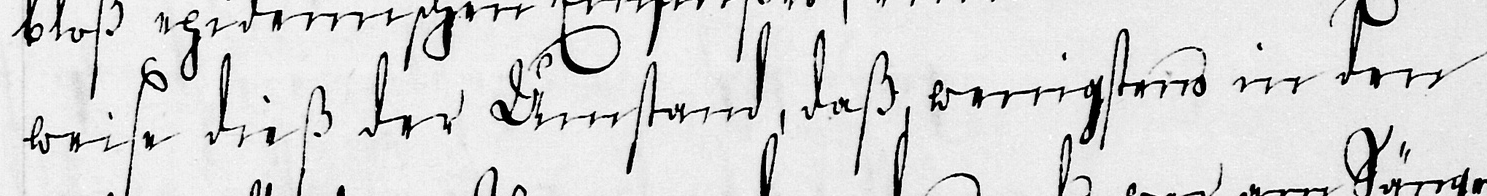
weise dieß der Umstand, daß wenigstens in den
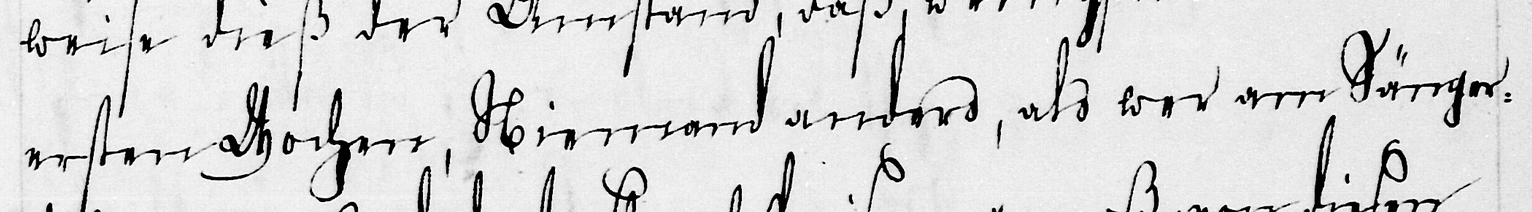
ersten Wochen, Niemand anders, als wer am Sänger¬
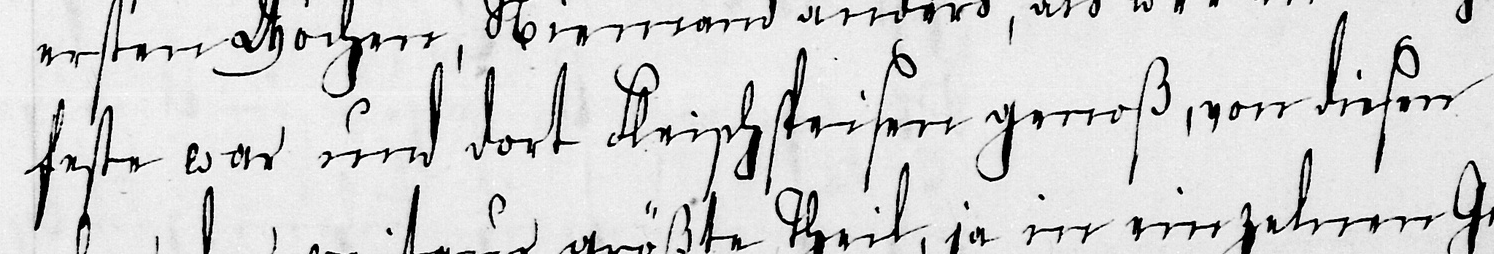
feste war und dort Fleischspeisen genoß, von diesen
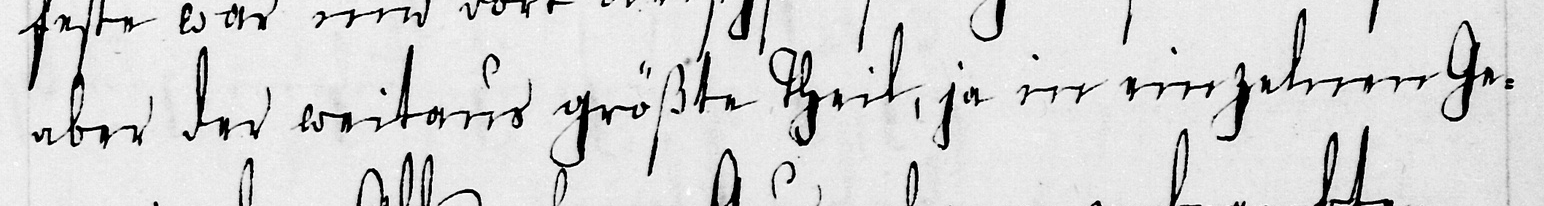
aber der weitaus größte Theil, ja in einzelnen Ge¬
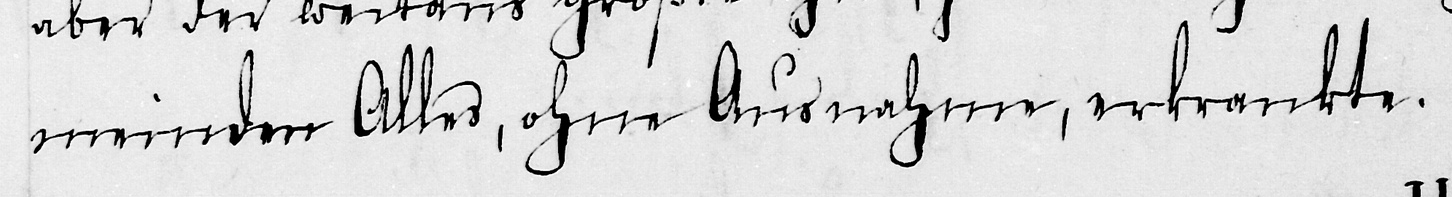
meinden Alles, ohne Ausnahme, erkrankte.
